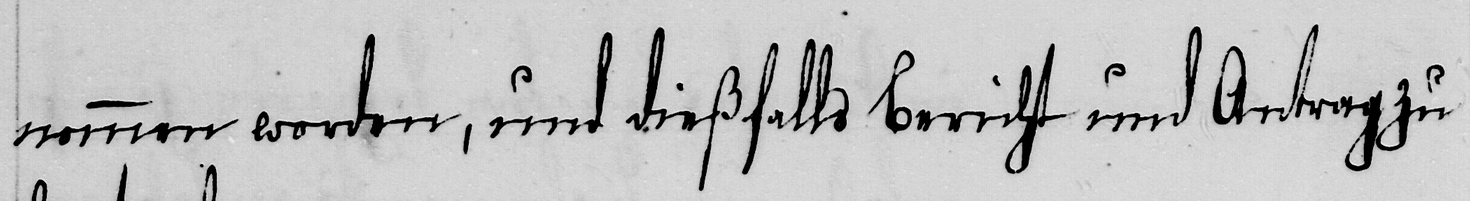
nommen worden, und dießfalls Bericht und Antrag zu
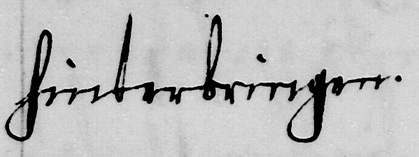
hinterbringen.
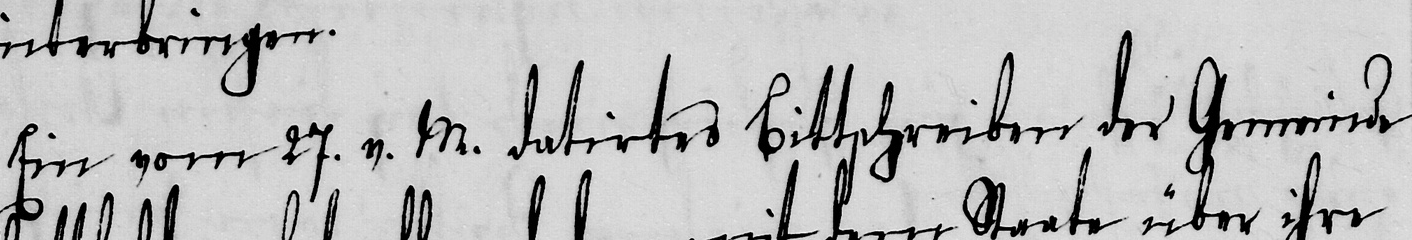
Ein vom 27. v. M. datirtes Bittschreiben der Gemeinde
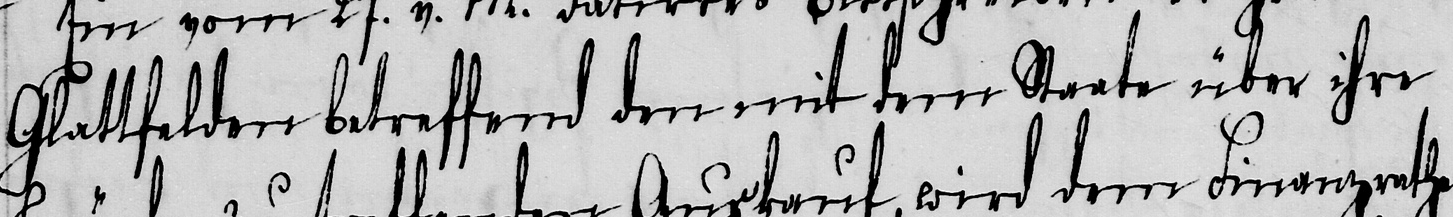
Glattfelden betreffend den mit dem Staate über ihre
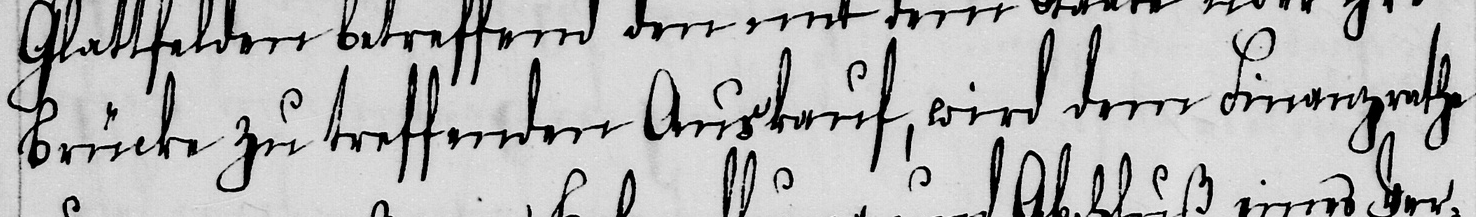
Brücke zu treffenden Auskauf, wird dem Finanzrathe
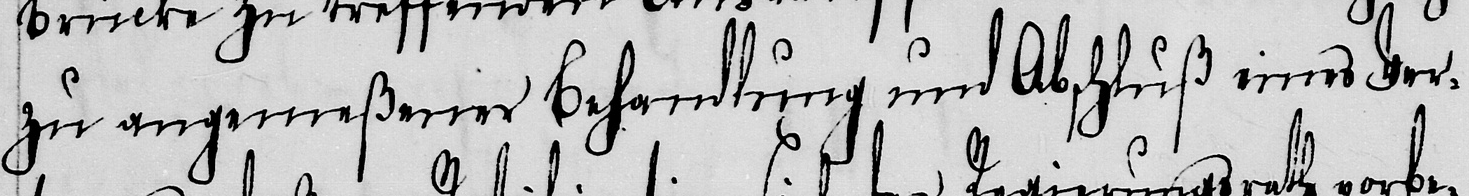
zu angemeßener Behandlung und Abschluß eines Ver¬
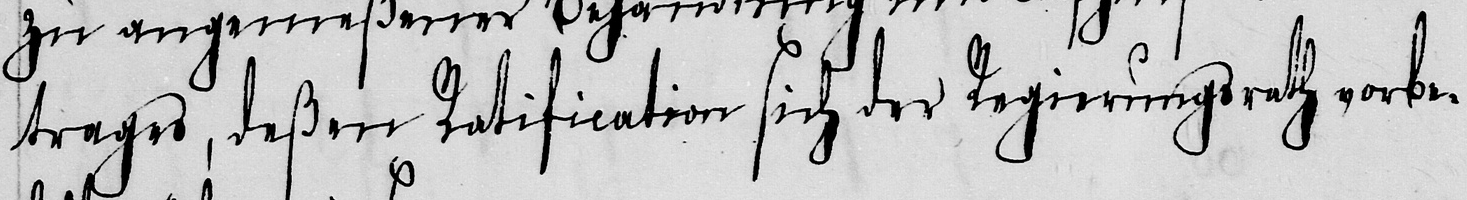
trages, deßen Ratification sich der Regierungsrath vorbe¬
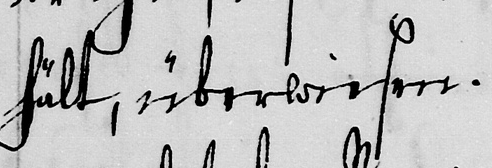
hält, überwiesen.
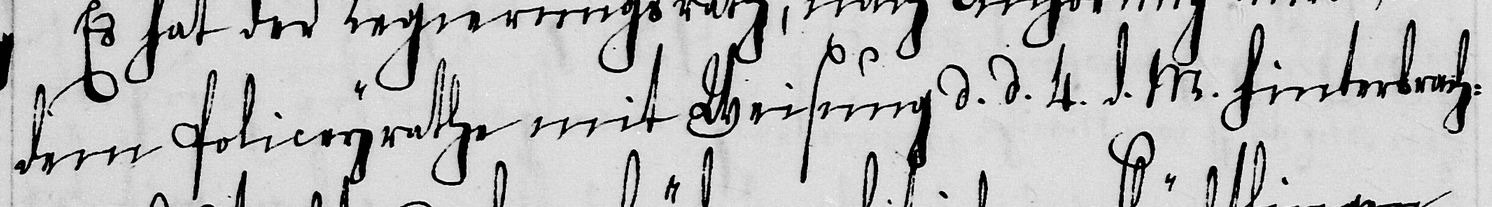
dem Policeyrathe mit Weisung d. d. 4. d. M. hinterbrach¬
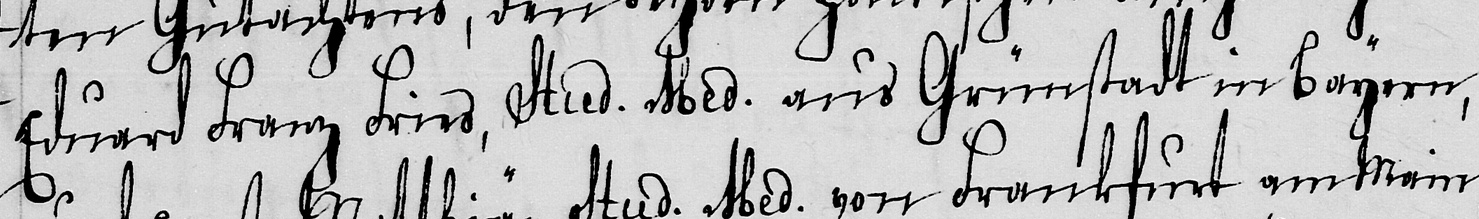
Eduard Franz Fries, Stud. Med. aus Grünstadt in Bayern,
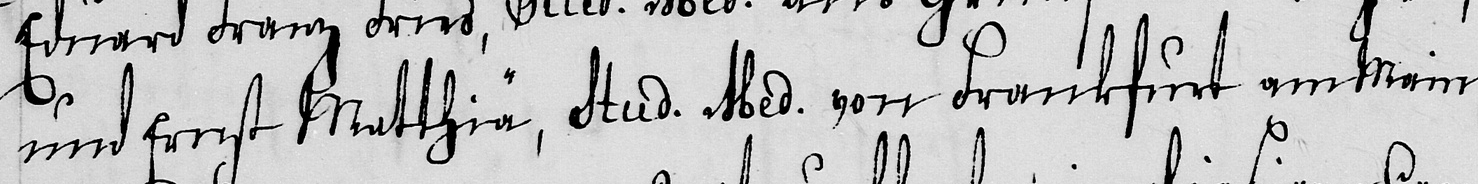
und Ernst Matthiä, Stud. Med. von Frankfurt am Main,
